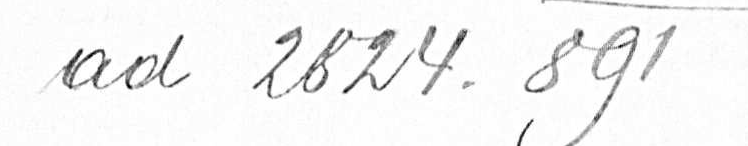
ad 2824. 891
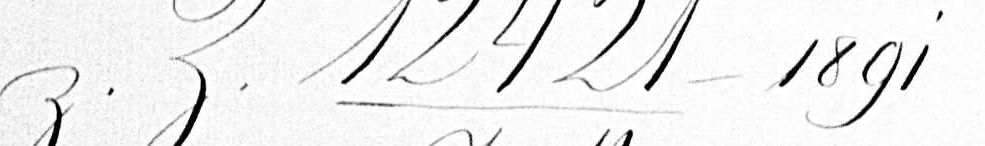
z. Z. 12421 - 1891
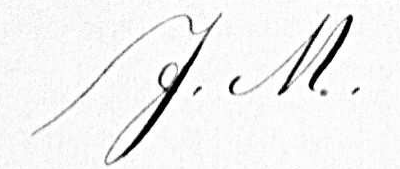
J. M.
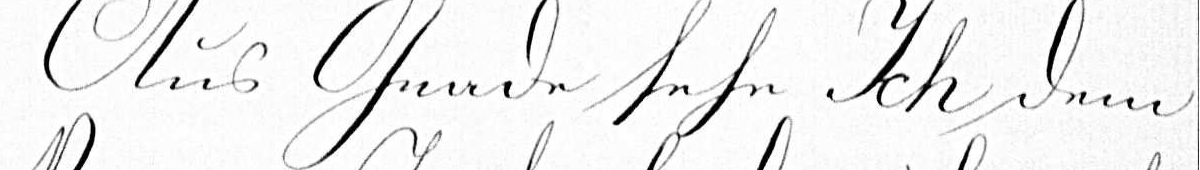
Aus Gnade sehn Ich dem
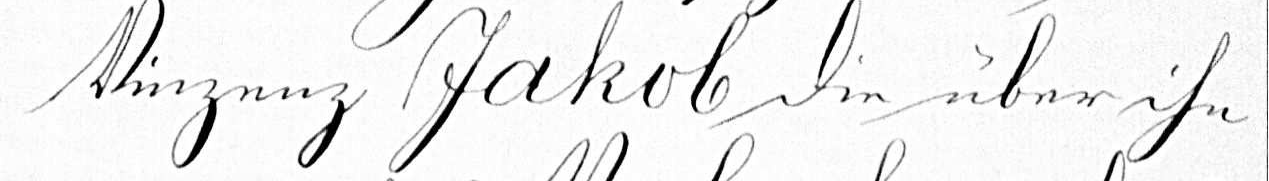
Vinzenz Jakob die über ihe
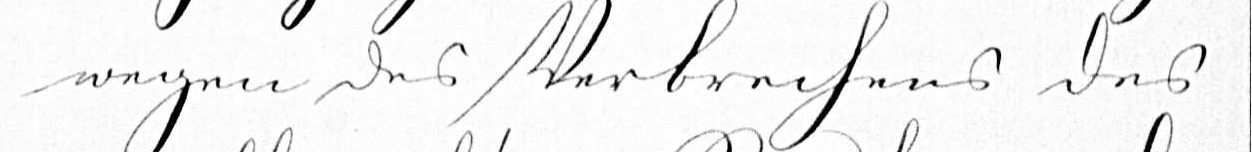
wegen des Webrechens des
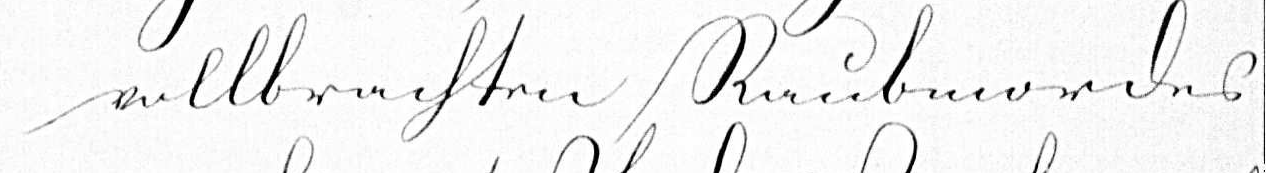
vollbrachten Raubwordes
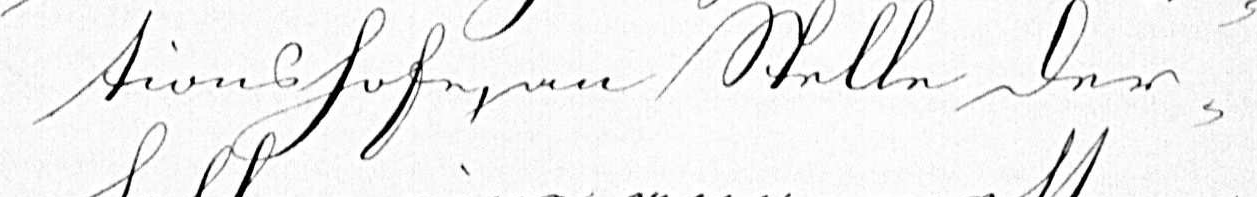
tionshoferan Stelle Der¬
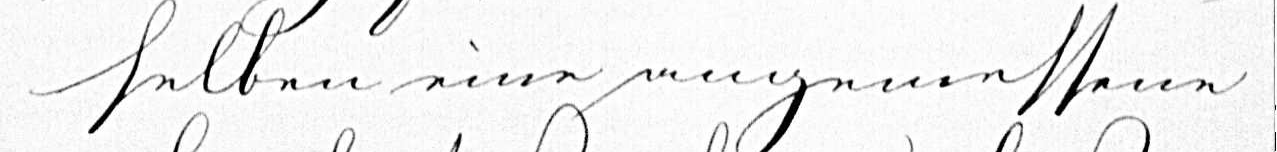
selben eine angenenssene
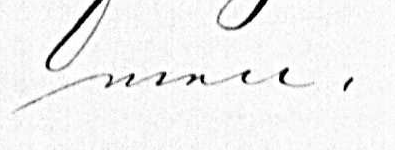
men.
